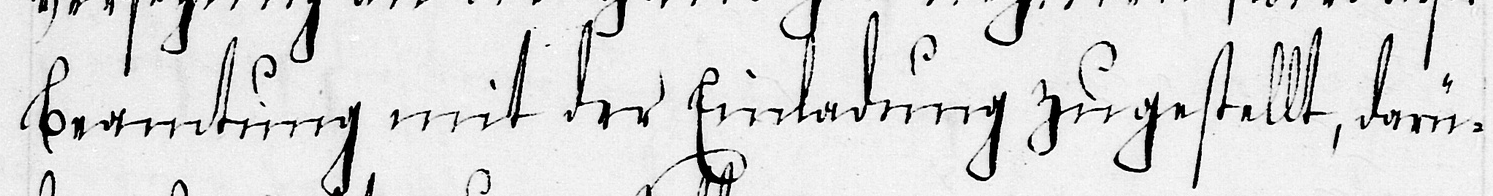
Beamtung mit der Einladung zugestellt, dar¬
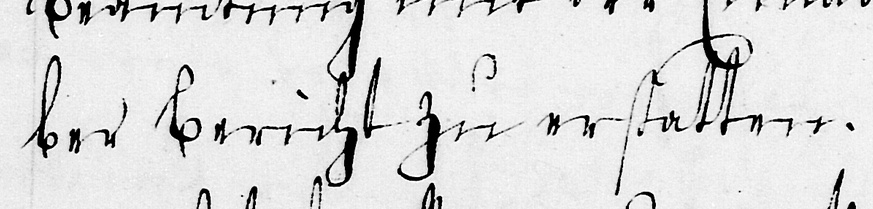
über Bericht zu erstatten.
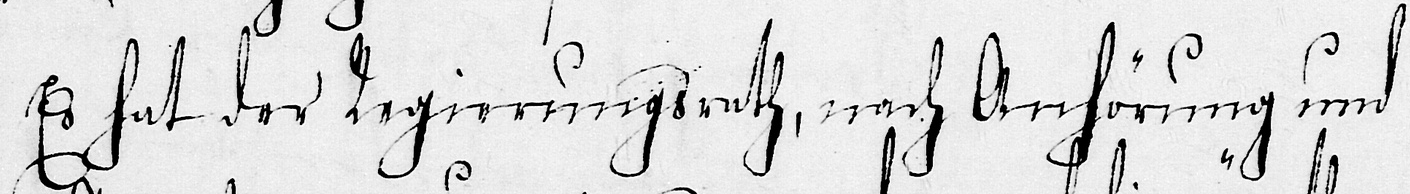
Es hat der Regierungsrath, nach Anhörung und
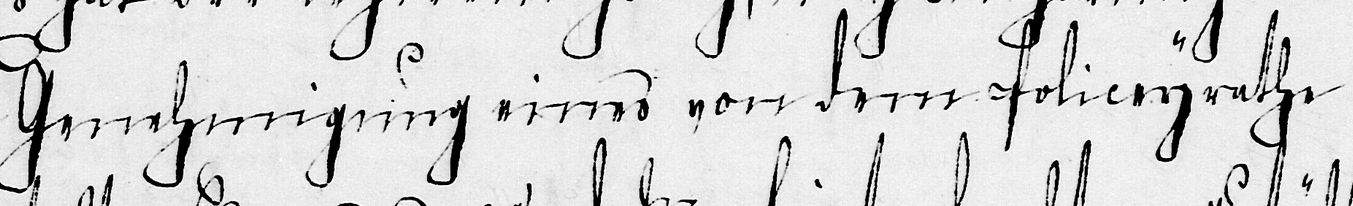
Genehmigung eines von dem Policeyrathe
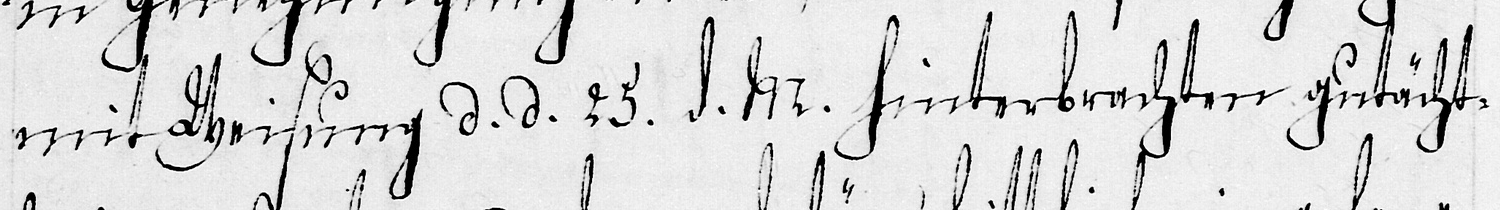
mit Weisung d. d. 25. d. M. hinterbrachten gutächt¬
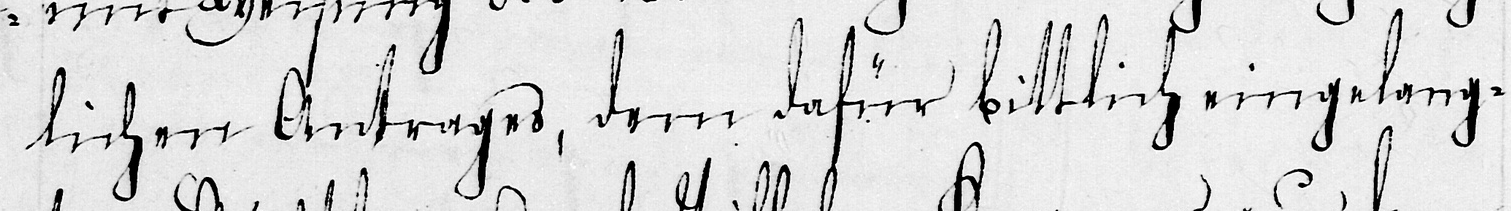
lichen Antrages, dem dafür bittlich eingelang¬
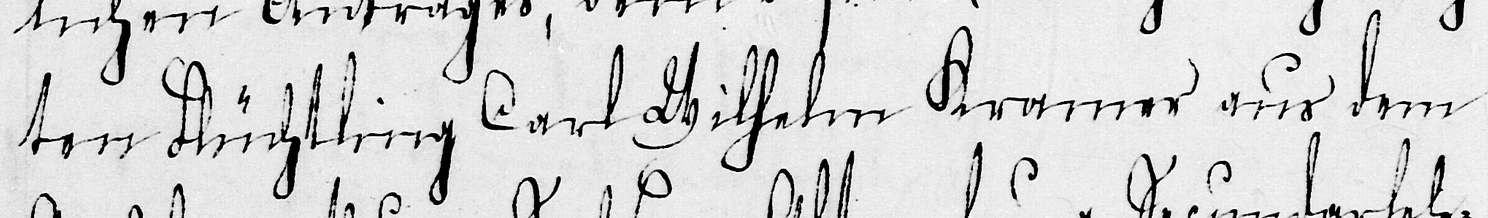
ten Flüchtling Carl Wilhelm Kramer aus dem
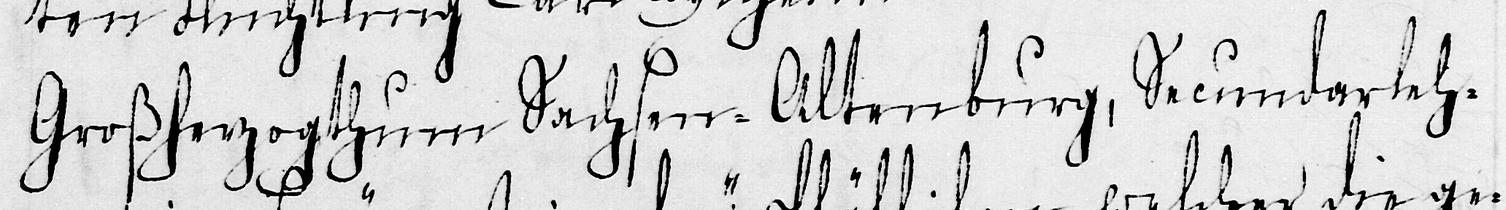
Großherzogthum Sachsen-Altenburg, Secundarleh¬
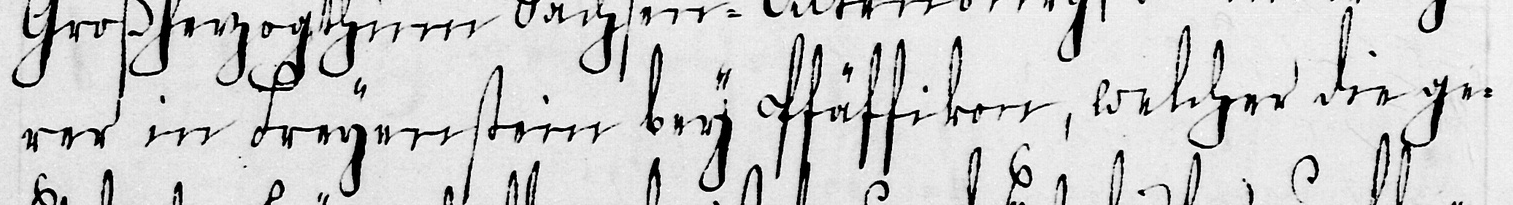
rer in Freyenstein bey Pfäffikon, welcher die ge¬
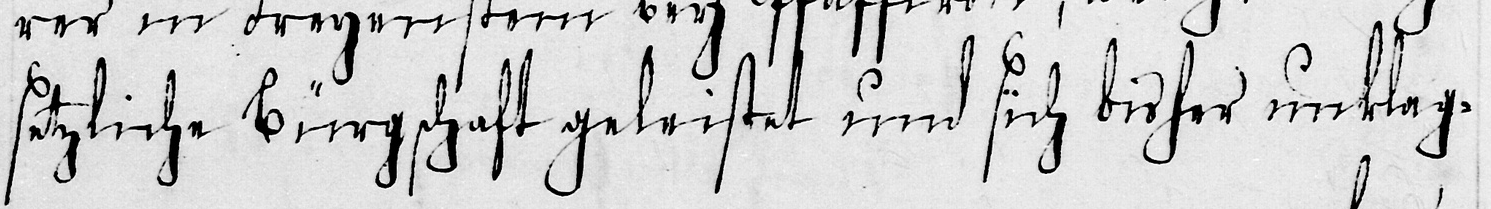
setzliche Bürgschaft geleistet und sich bisher unklag-
